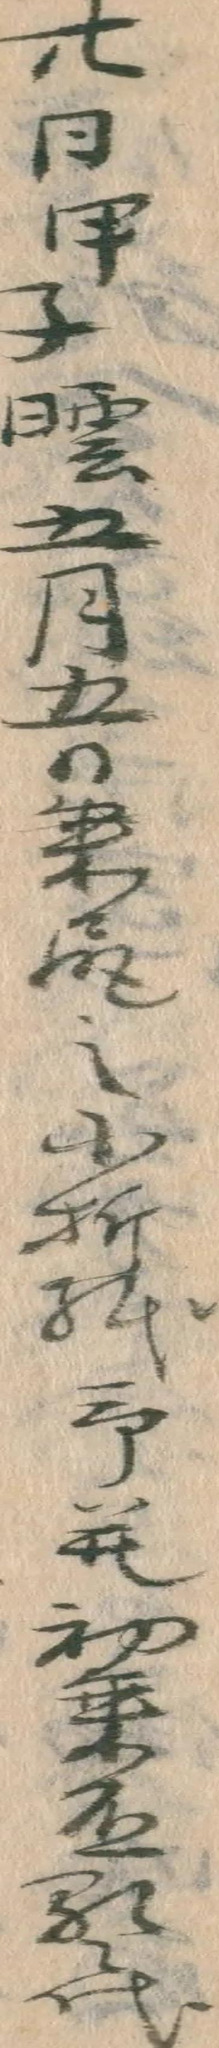廿日甲子雲五月五日乗尻之小折紙予并初乗丕顕之代
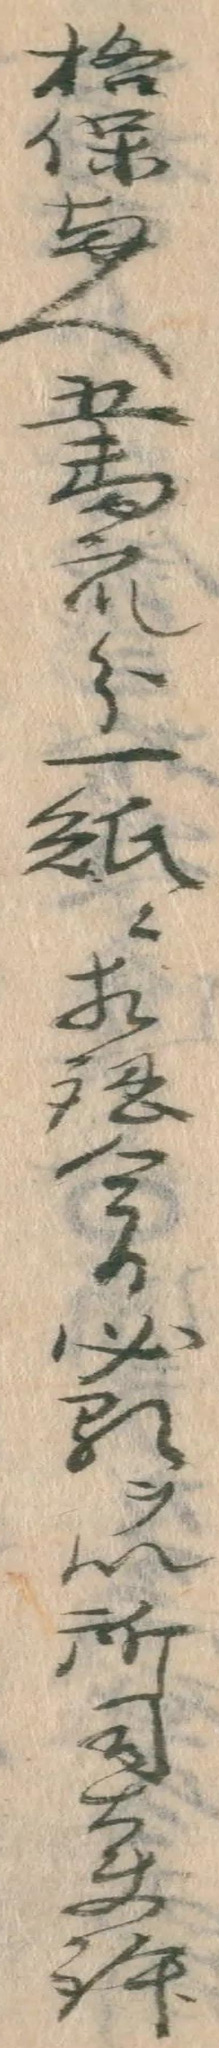格保両人五番衆分一紙ニ相認今日必顕ヲ以所司大夫許
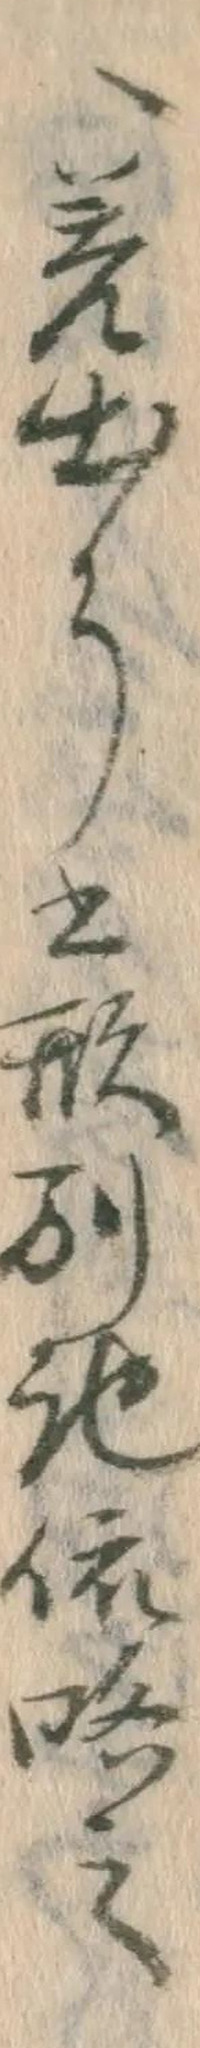へ差出了書形別記依略之
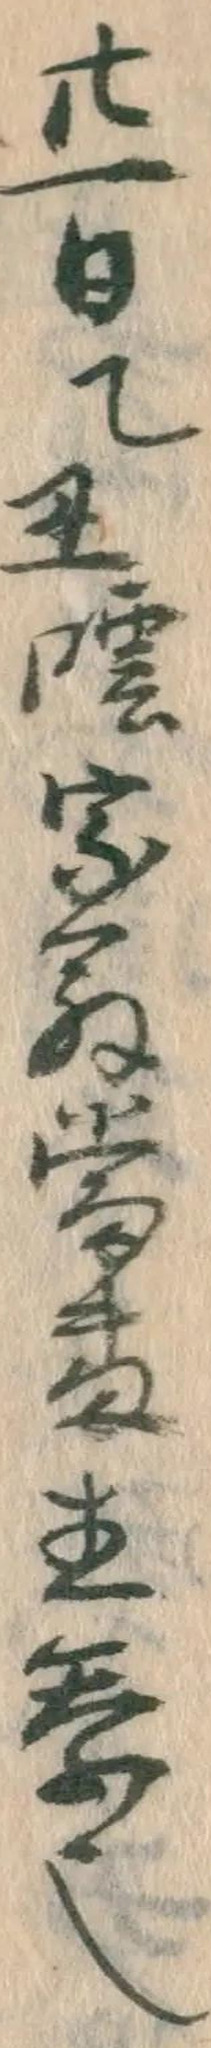廿一日乙丑晴家弁當番直参也
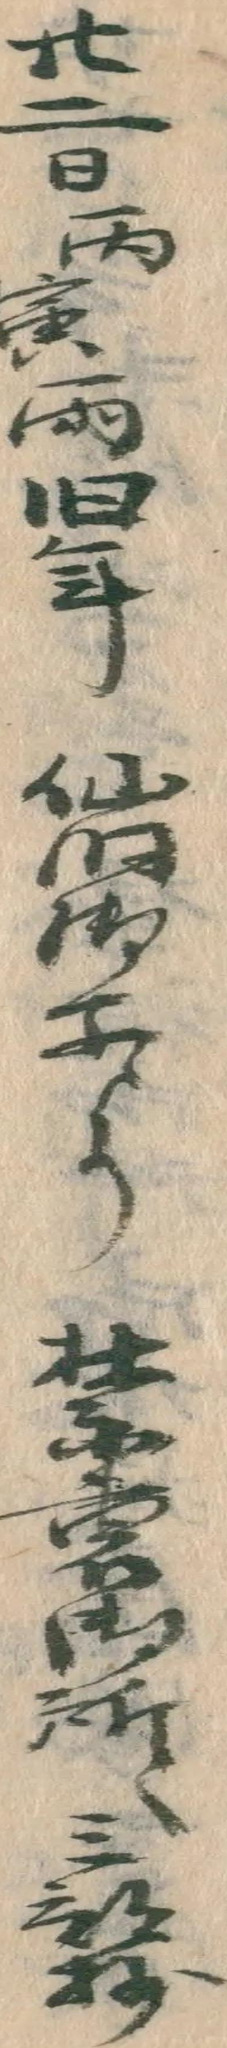廿二日丙寅雨旧年仙洞御所より禁宮御所へ三部抄
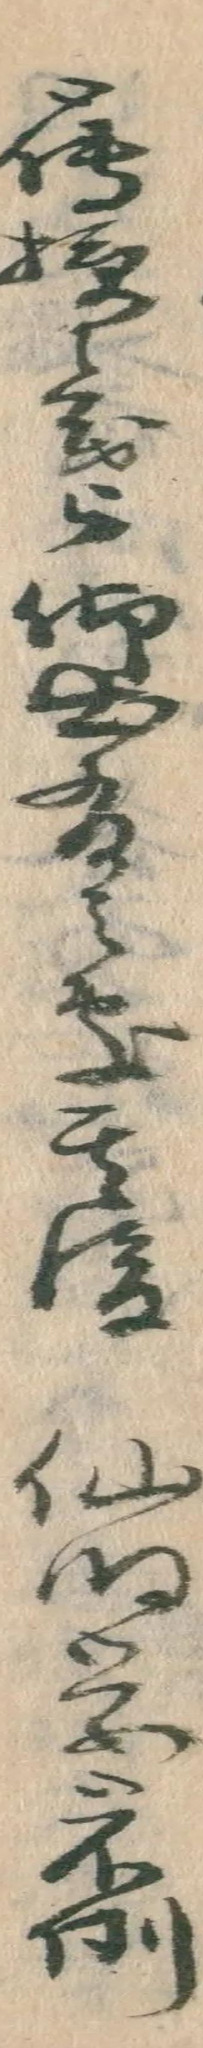御傳損之義被仰出有之處其後仙明御所御不例
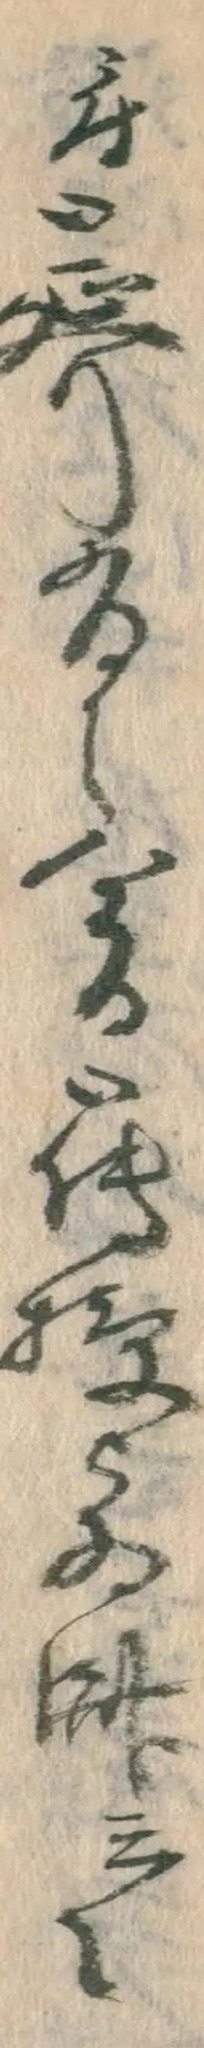ニ付御延引有之今日御傳授被為済云々
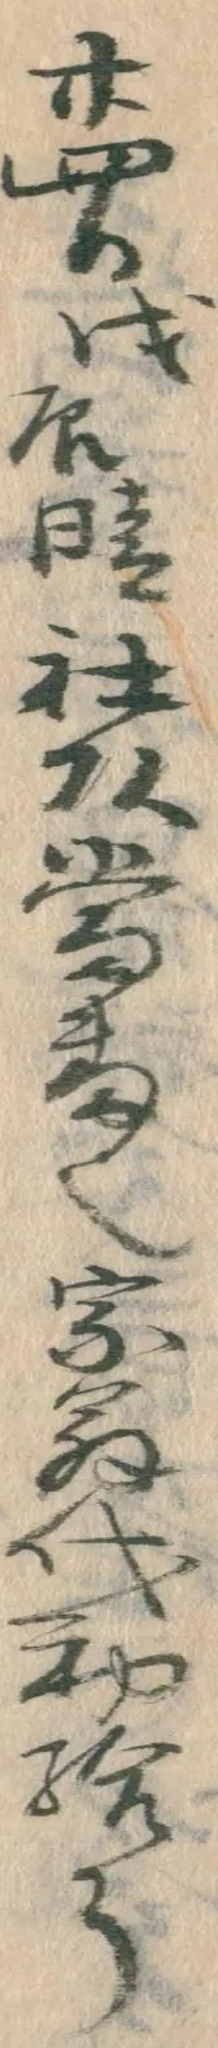廿四日戊辰晴社頭當番也家翁代勤給了
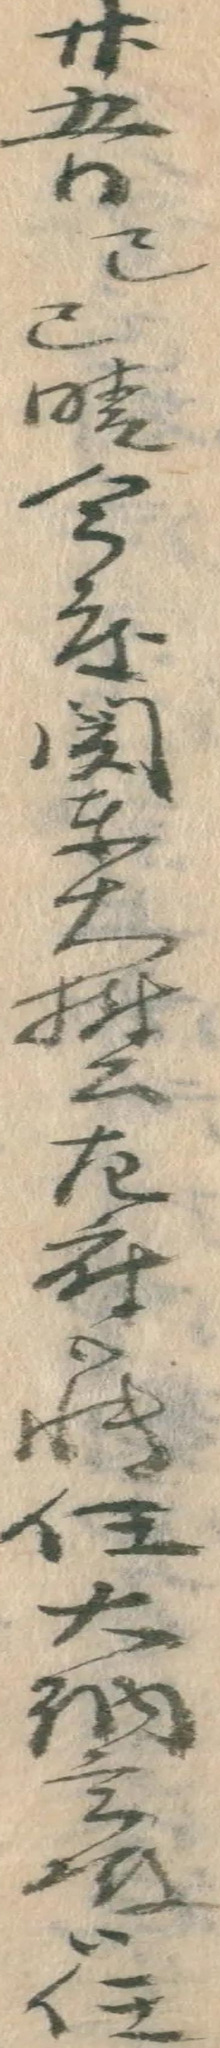廿五日己巳晴今度関東大樹公左府御轉任大納言様御任
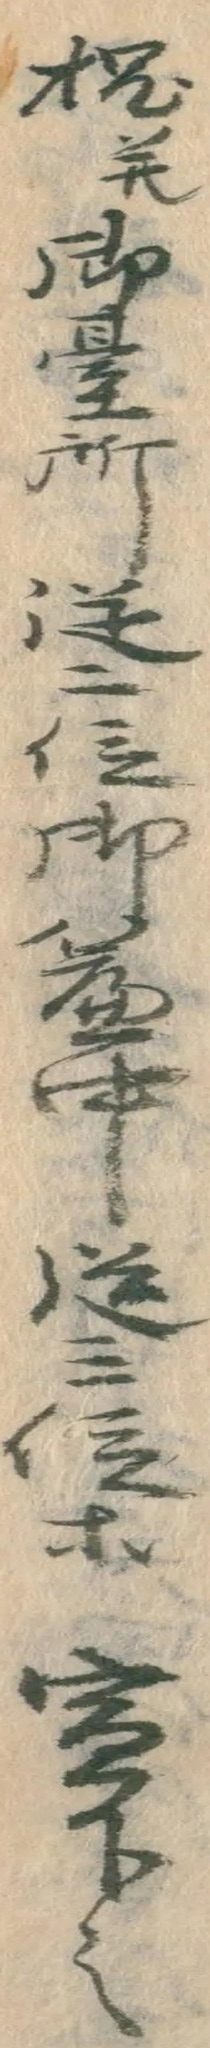祝并御䑓所従二位御簾中従三位等宣下也

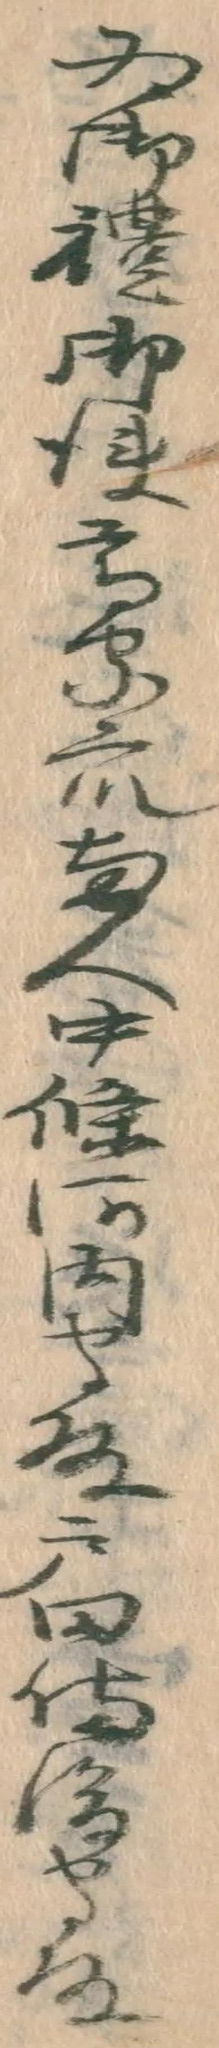為御禮御使高家衆両人中條河内守殿戸田備後守殿等
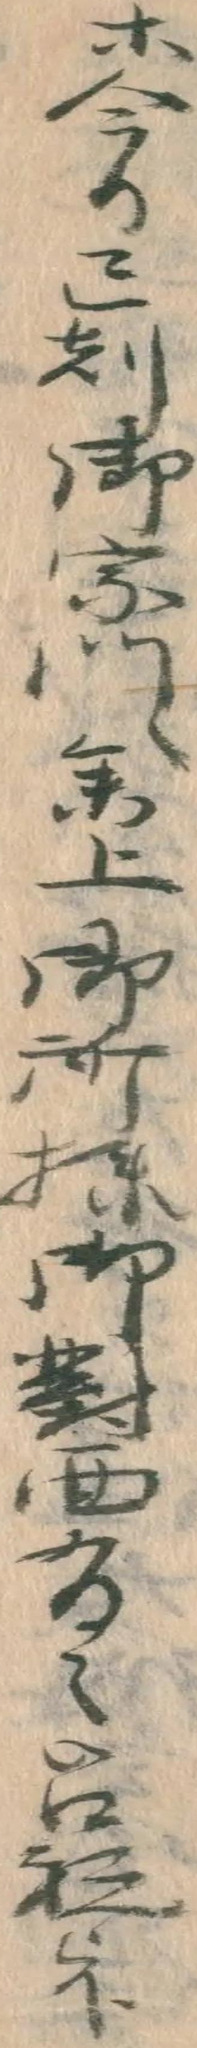今日巳刻御家門へ参上御所様御對面有之御口祝被下
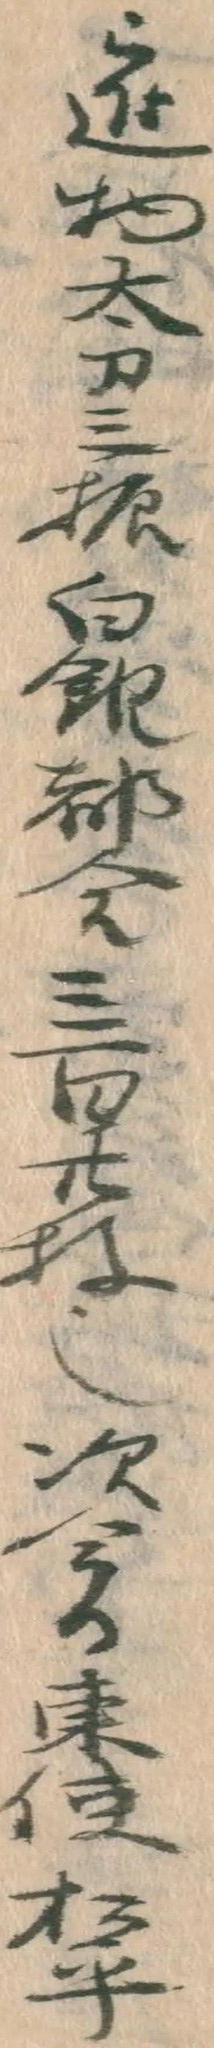被進物太刀三振白銀都合三百廿枚也次今日東使松平
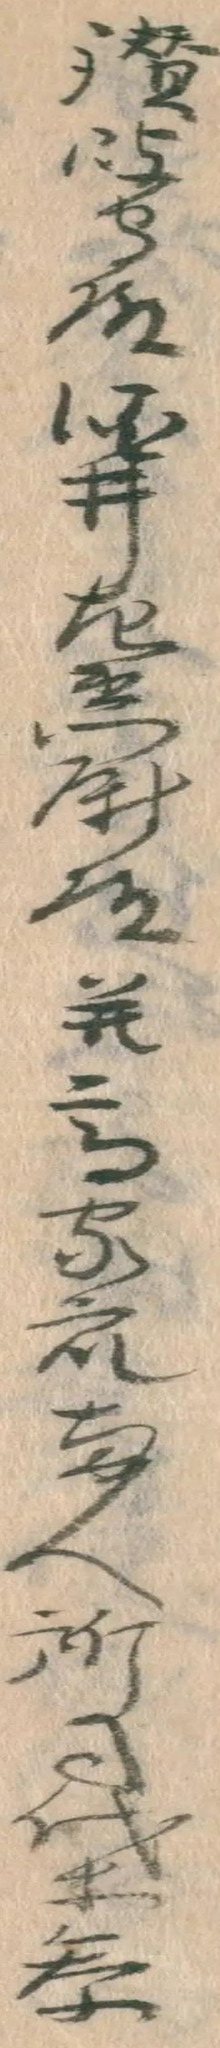讃岐守殿酒井左衛門尉殿并高家衆両人所司代等参
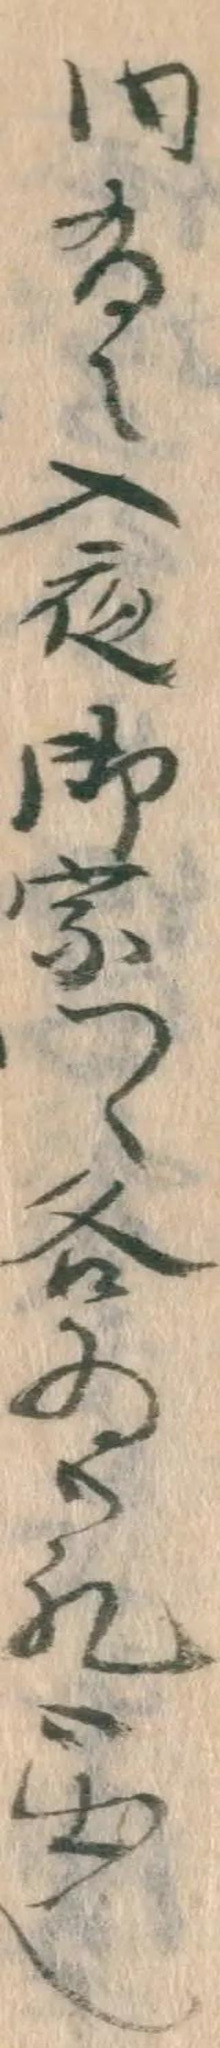同有之入夜御家門候各為御礼御出也
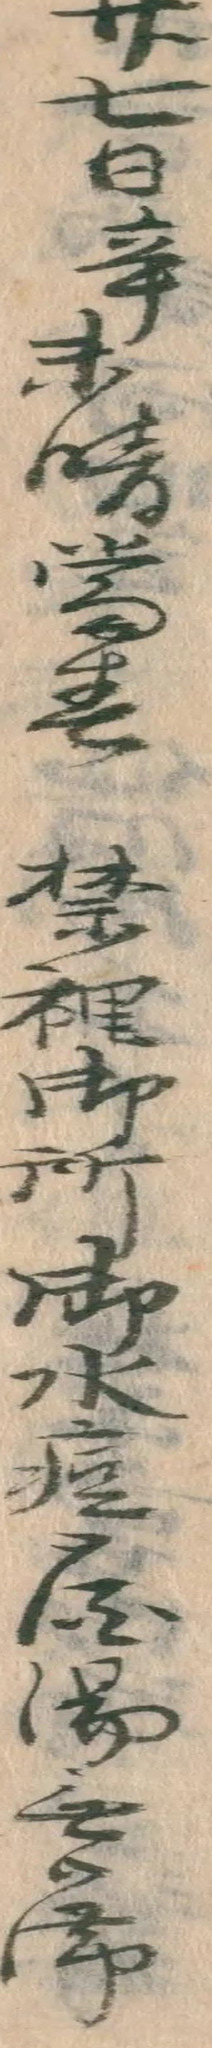廿七日辛未晴當春禁裡御所御水痘屈湯無滞
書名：賀茂社記録. 第63冊
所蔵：国立国会図書館 National Diet Library, JAPAN
